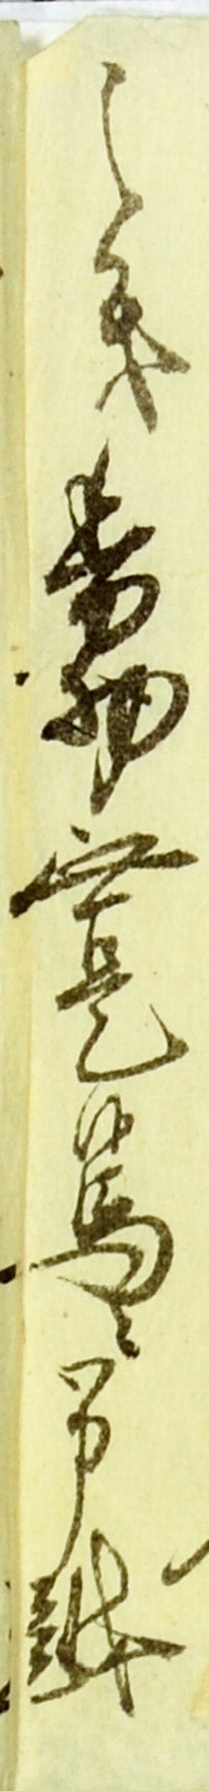之義書物無是候馬ニ御申越
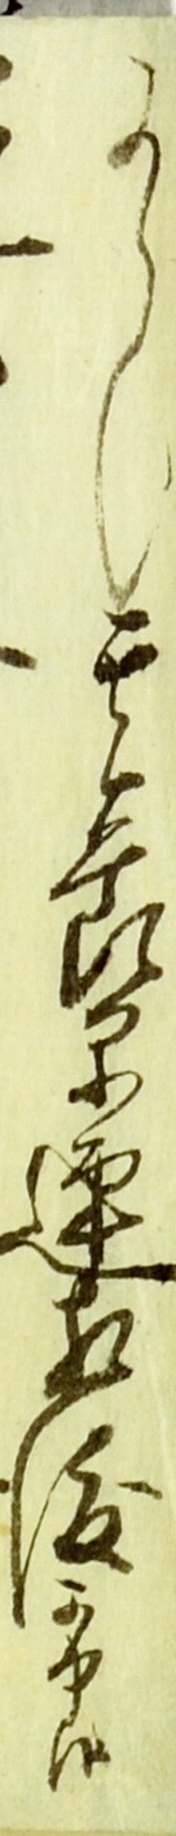可被申候其節早速相渡可申候
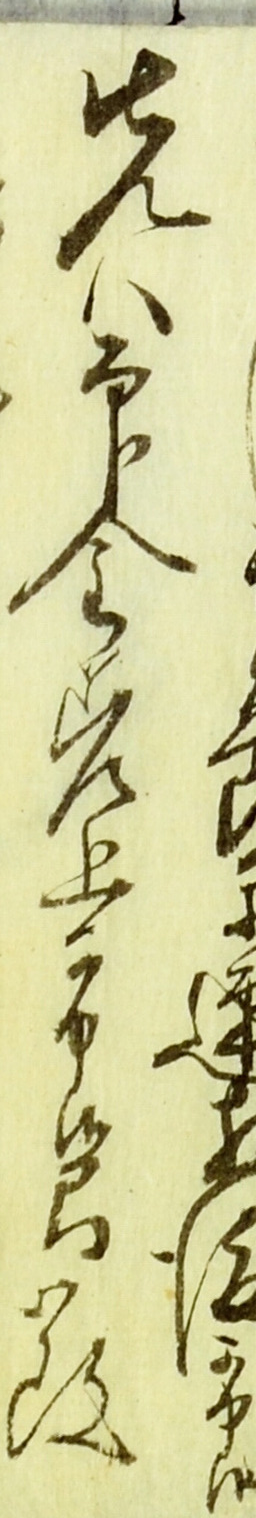先ハ印金差上可申候間御改
